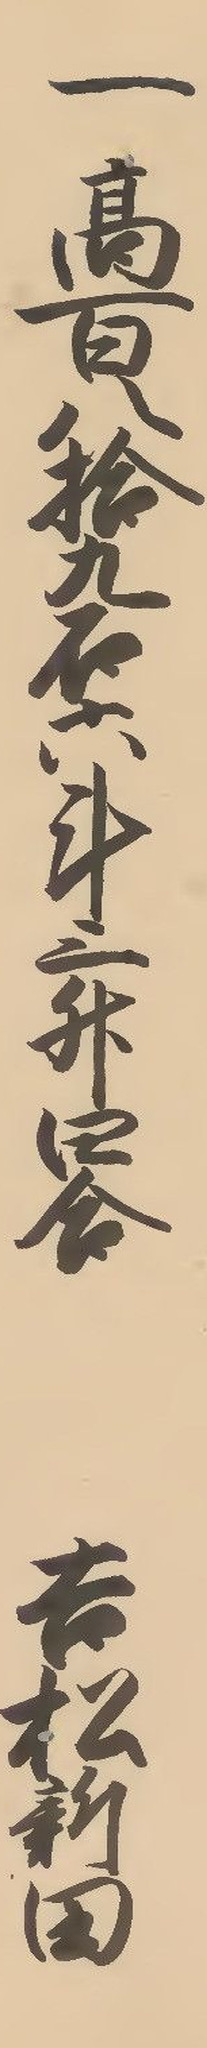一高百八拾九石六斗三升四合吉松新田
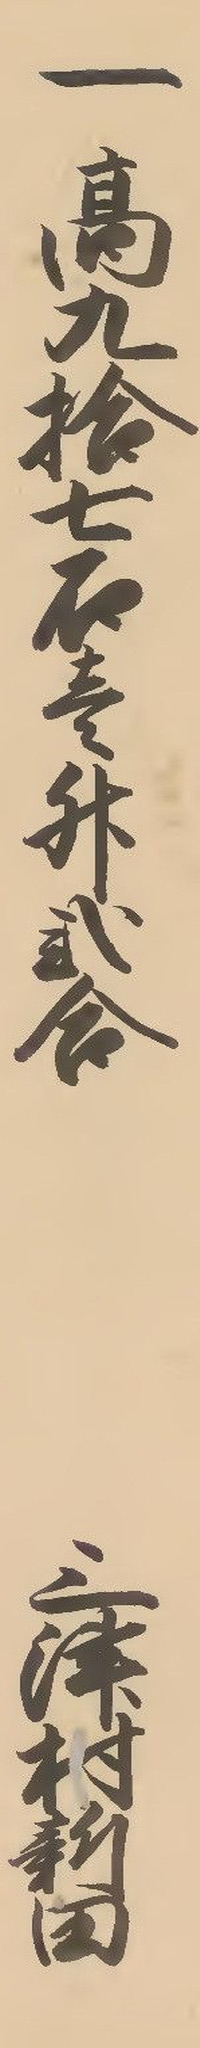一高九拾七石壱升弐合三津村新田
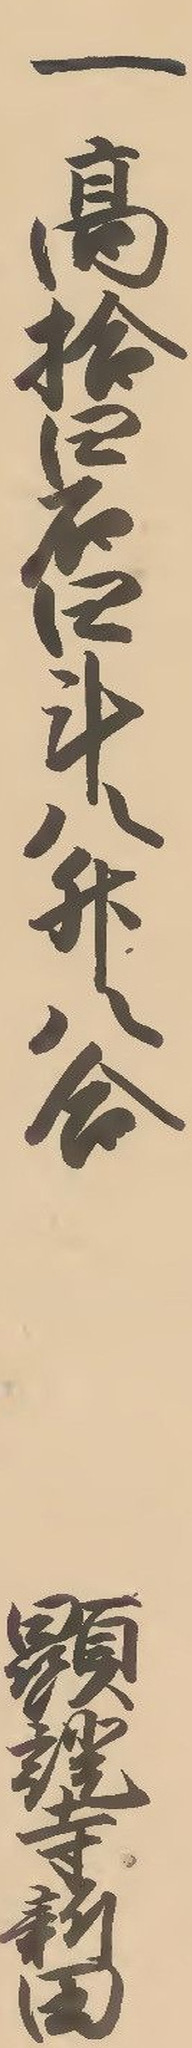一高拾四石四斗八升八合顕証寺新田
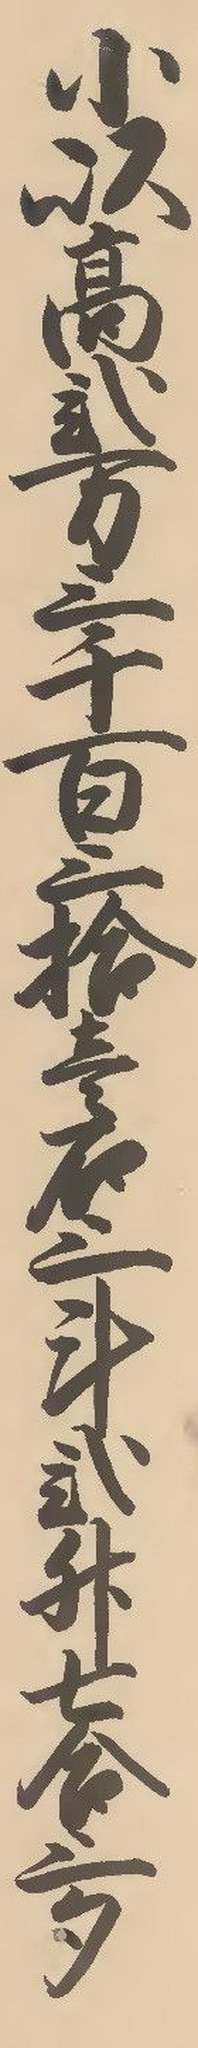小以高弐万三千百三拾壱石三斗弐升七合三勺

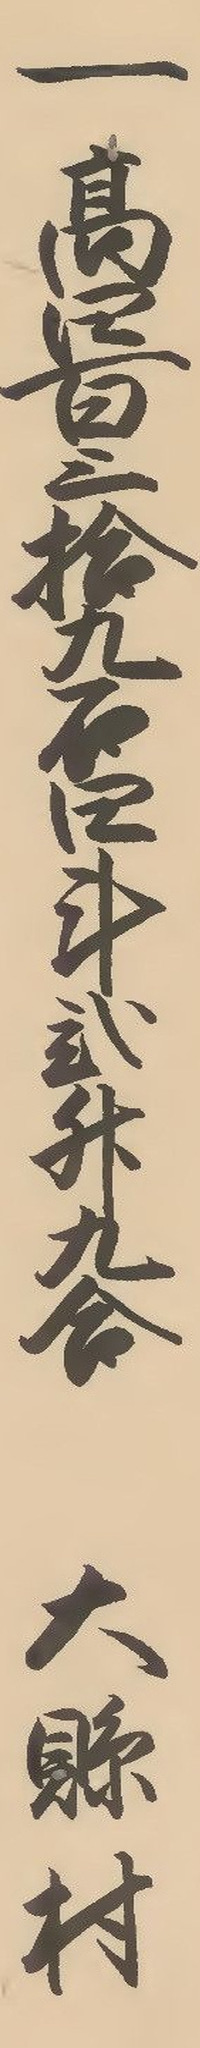一高四百三拾九石四斗弐升九合大県村
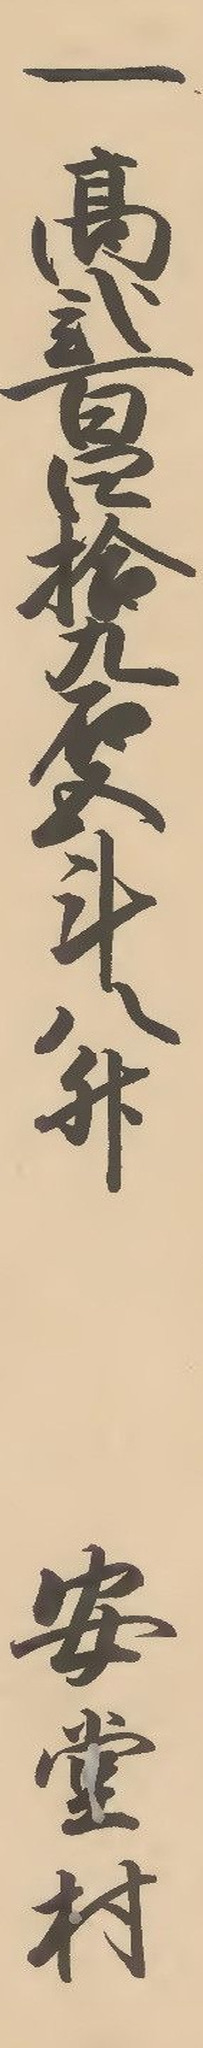一高弐百四拾九石五斗八升安堂村
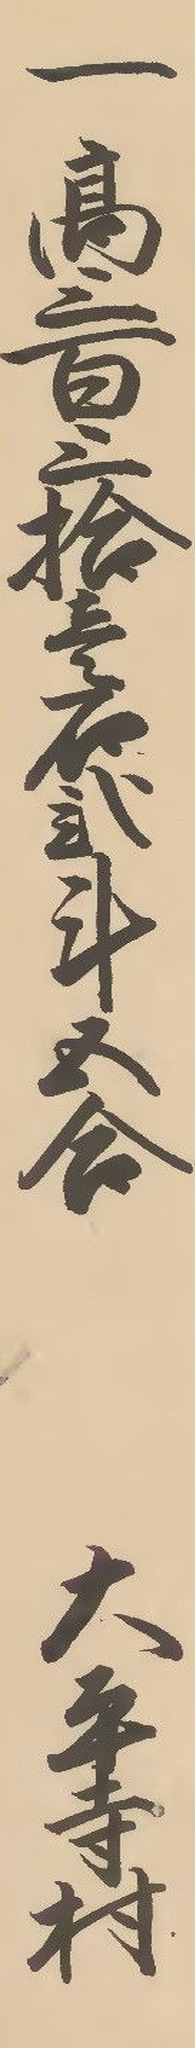一高三百三拾壱石弐斗五合大平寺村
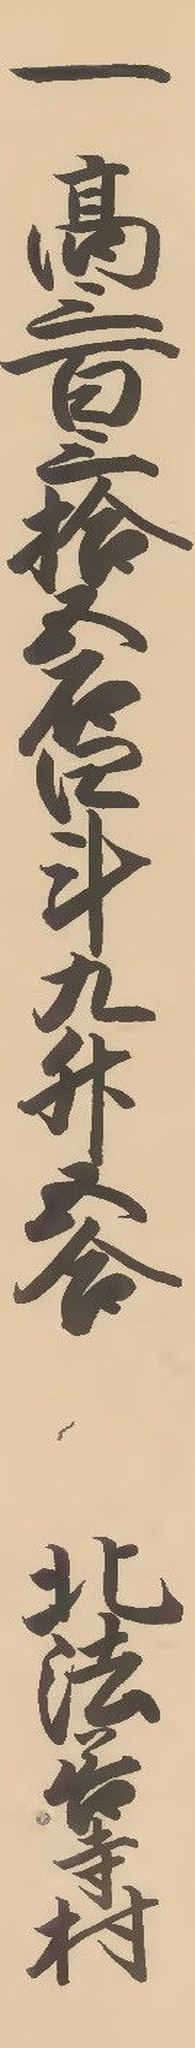一高三百三拾五石四斗九升五合北法善寺村
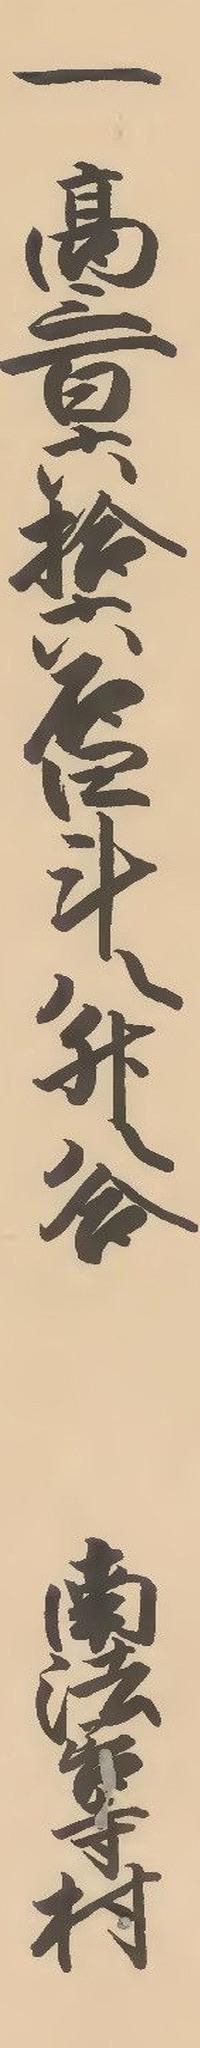一高三百六拾六石四斗八升八合南法善寺村
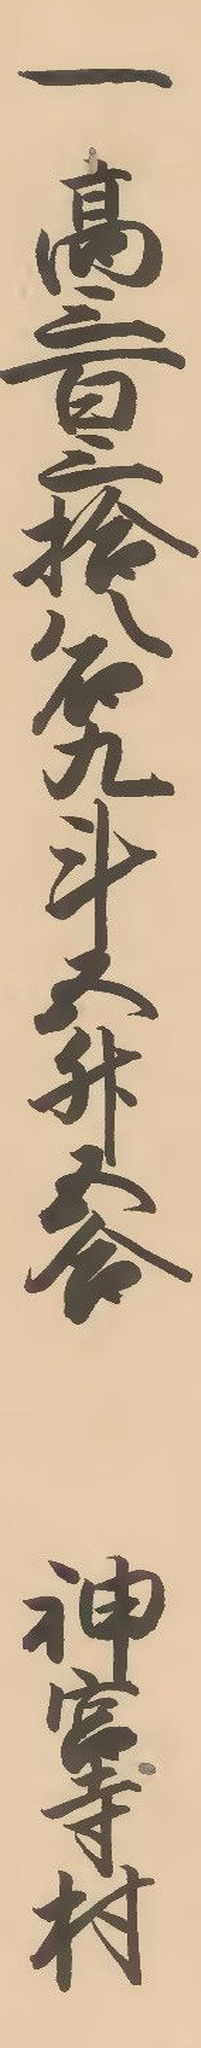一高三百三拾八石九斗五升五合神宮寺村
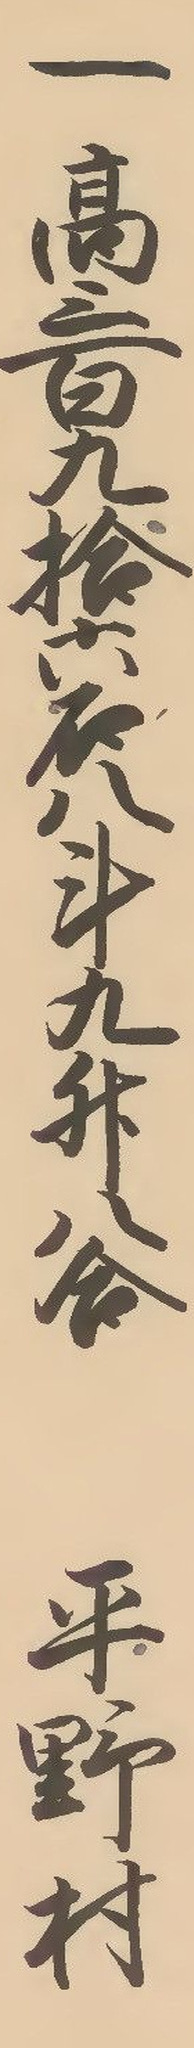一高三百九拾六石八斗九升八合平野村

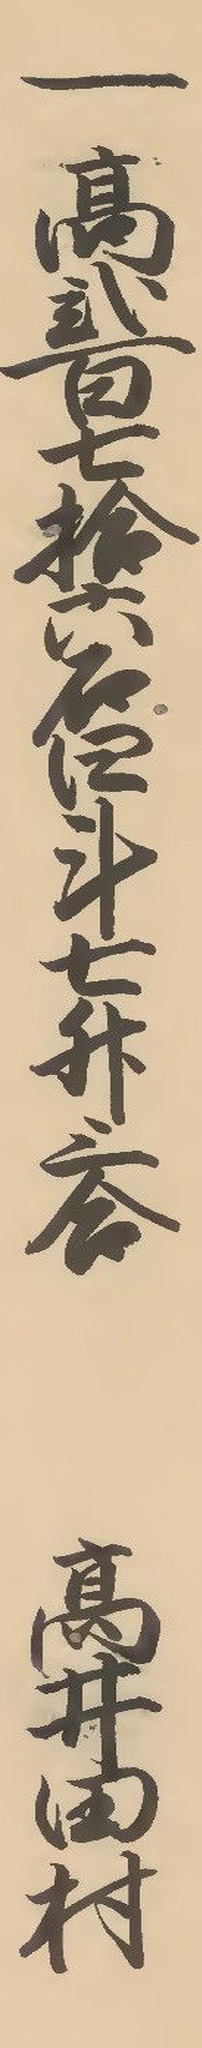一高弐百七拾六石四斗七升三合高井田村
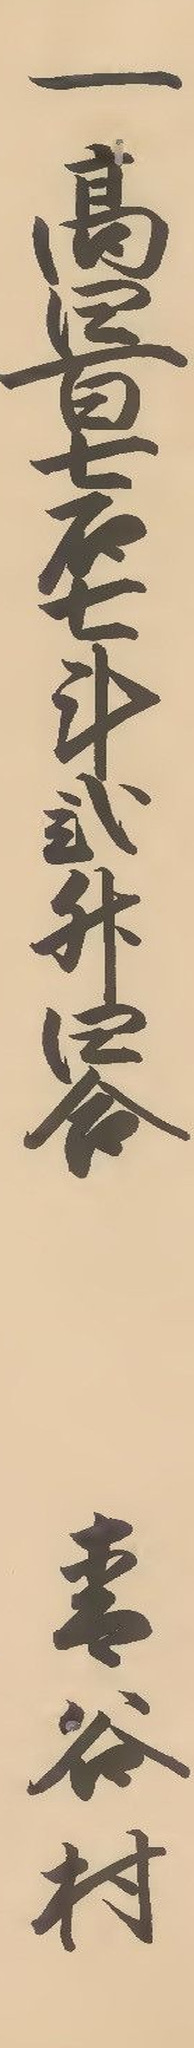一高四百七石七斗弐升四合青谷村
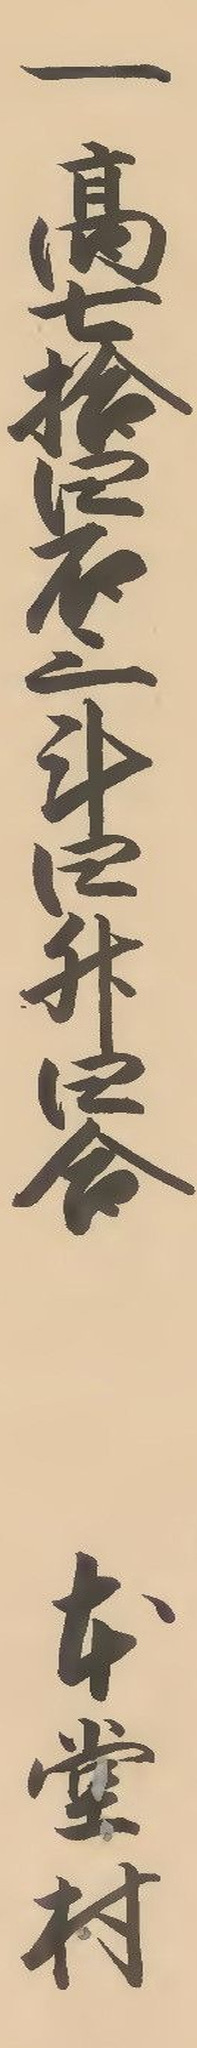一高七拾四石三斗四升四合本堂村
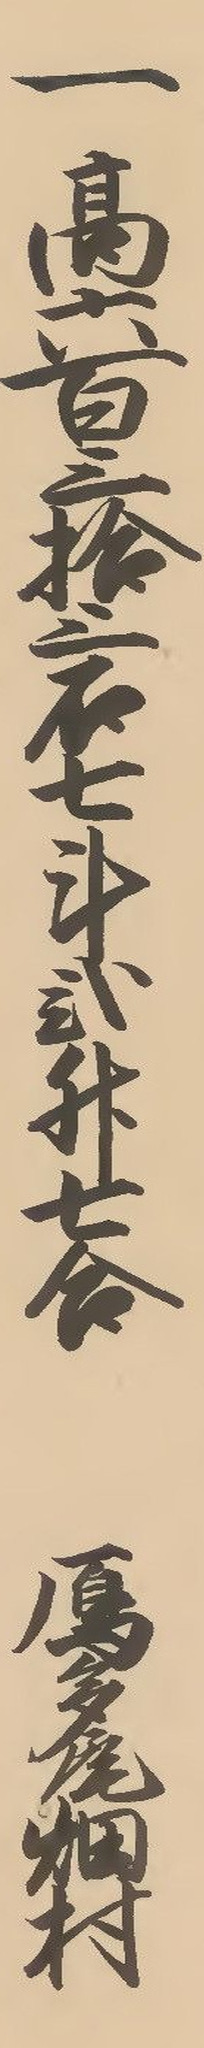一高六百三拾三石七斗弐升七合雁多尾畑村
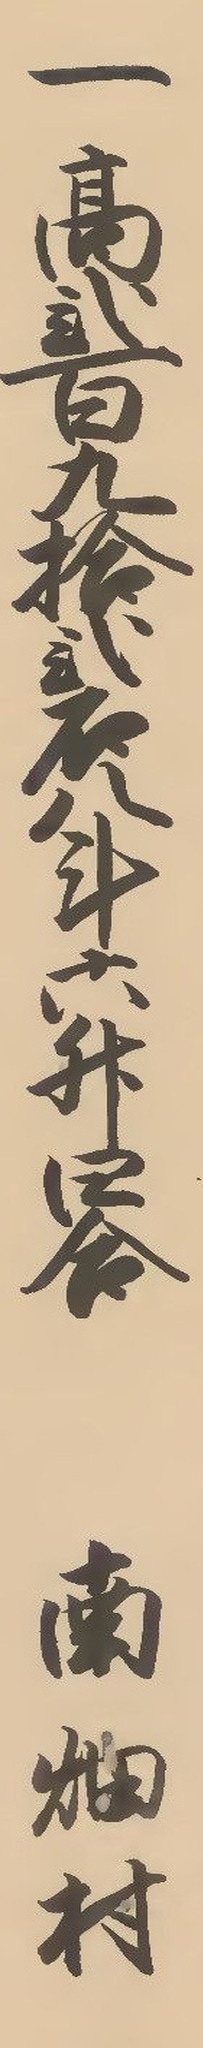一高弐百九拾弐石八斗六升四合南畑村
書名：河内国郷帳
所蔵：国立公文書館 National Archives of Japan
